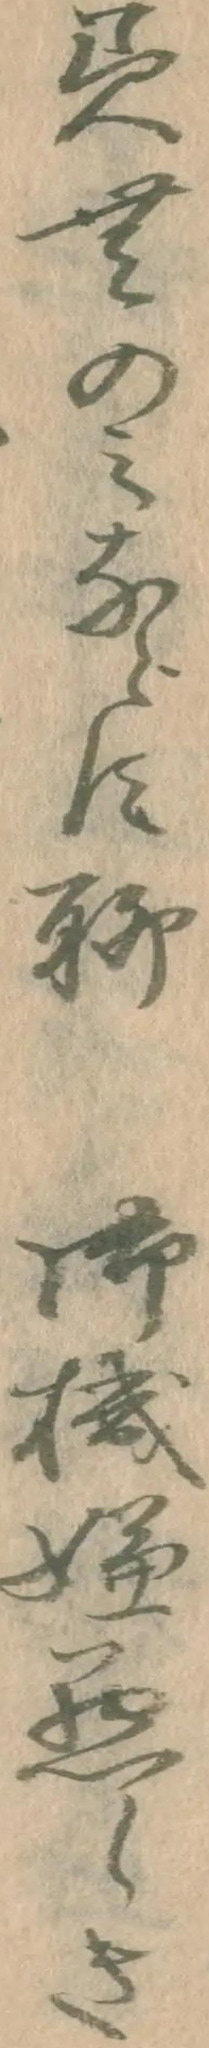美無のみなら須聊御機嫌悪しき
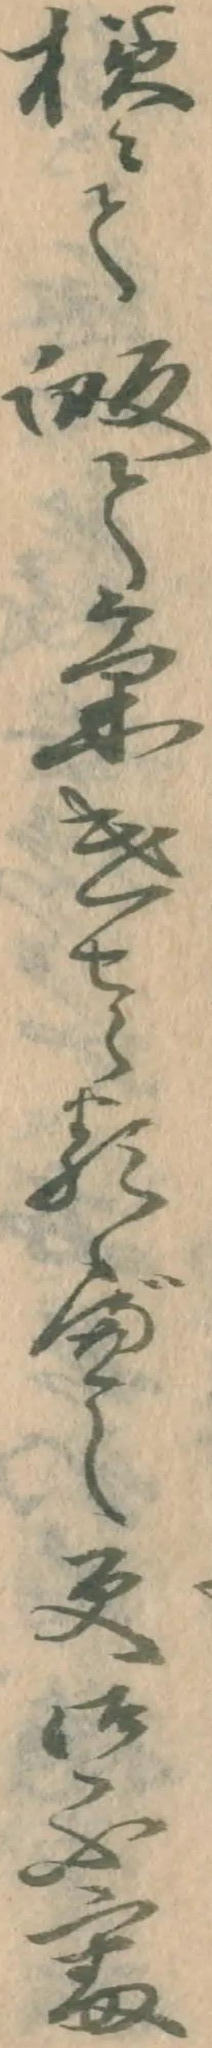様にて皈て参遣せら類扁し更御ふ審

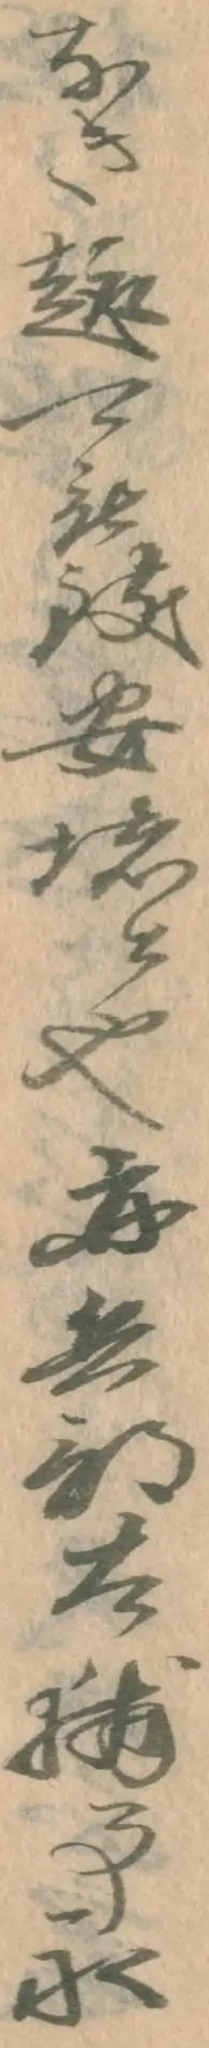なき趣可被安堵と也亦兵部太輔事永
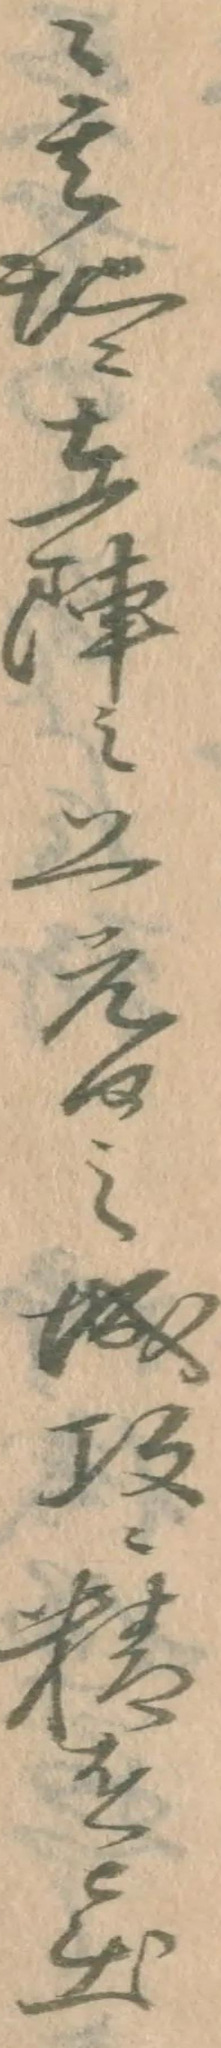に其地に在陣之上元日之城攻に精を被出
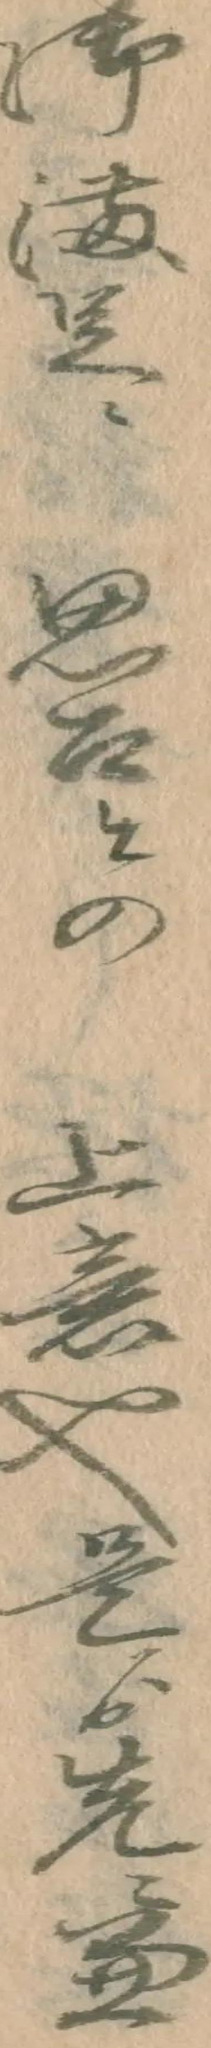御満足に思召との上意也是ゟ先に兼
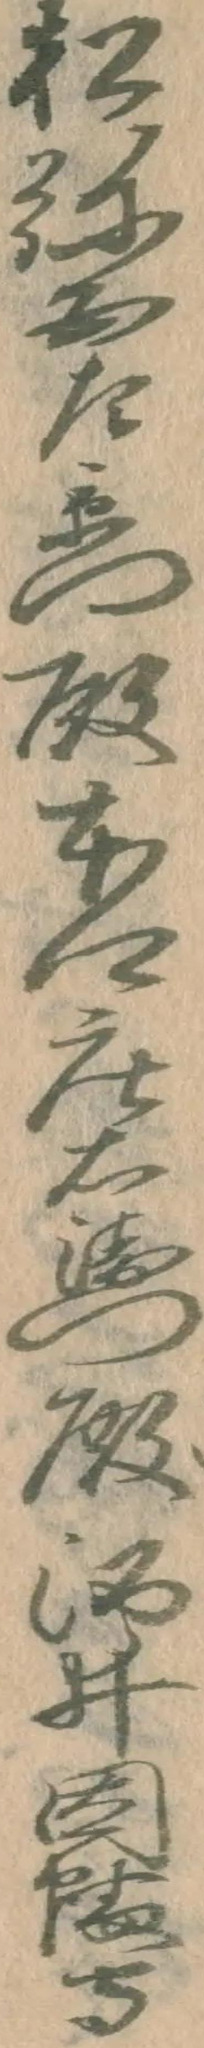松弥五左衛門殿本郷庄右衛門殿酒井因幡守
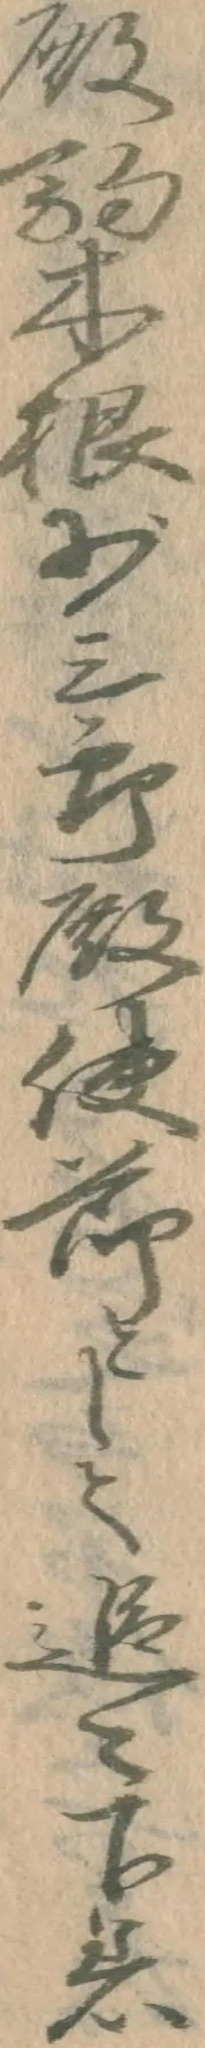殿駒木根少三郎殿使節として追々下着
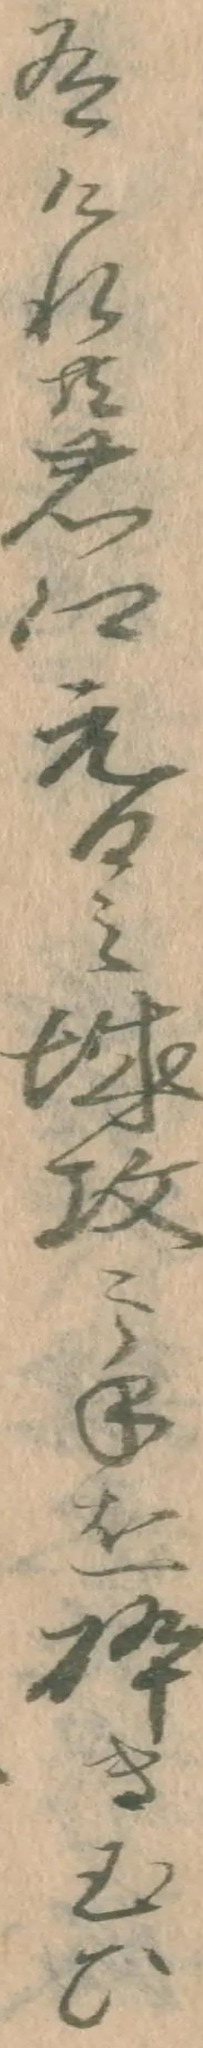有けれ共忠郷元日之城攻に手を枠きむひ
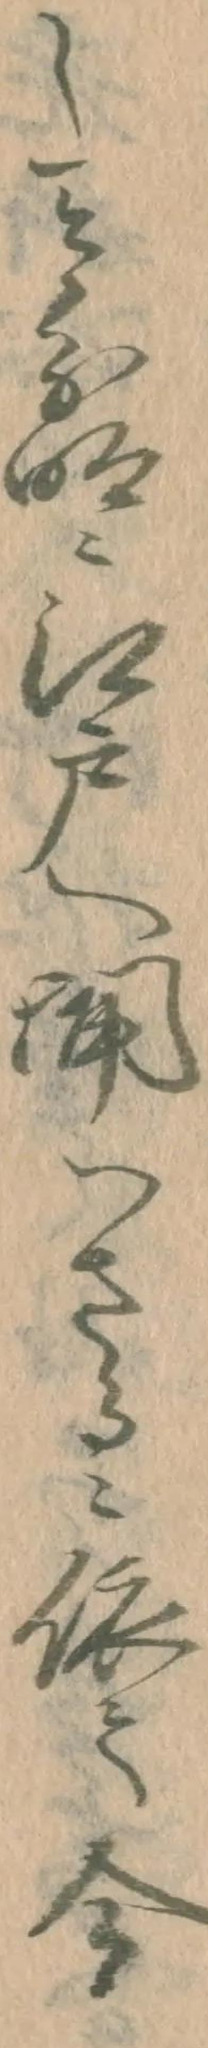して分明に江戸へ聞へさるに依て今
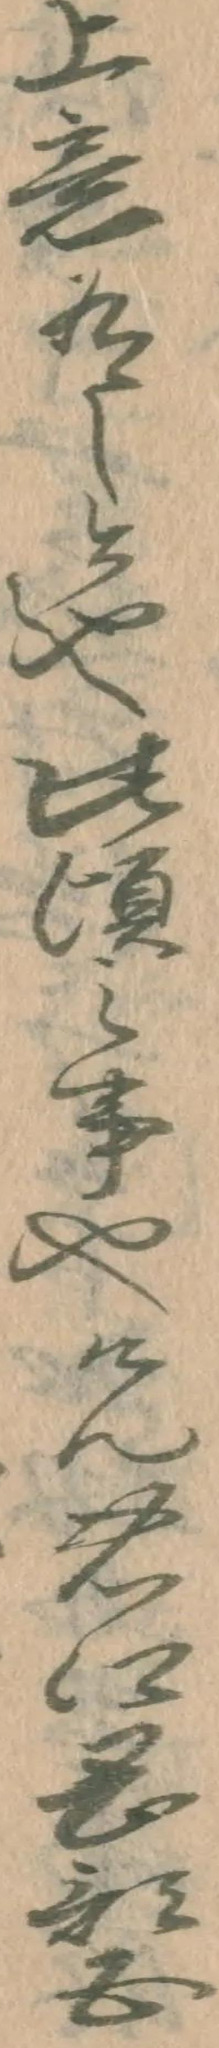上意有しと也此頃之事也けん忠郷岡部五
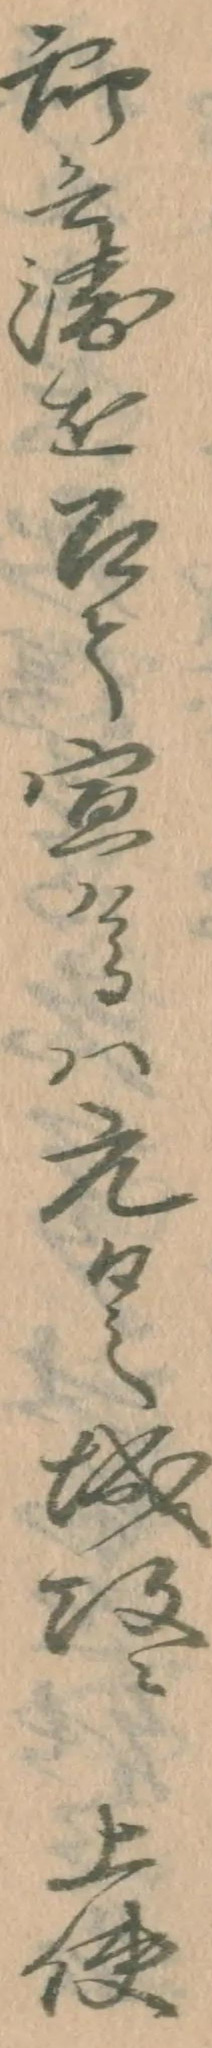郎兵衛を召て宣けるは元日之城攻に上使
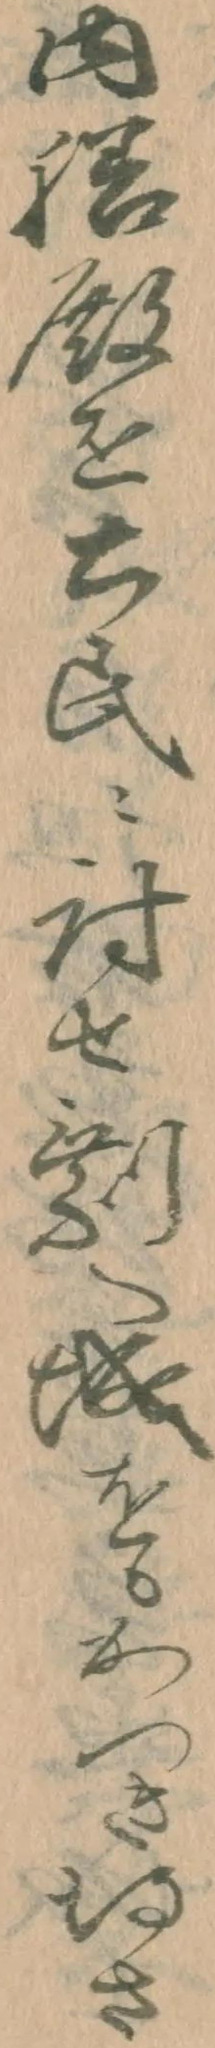内膳殿を土民に討せ剰へ城をもかつき得さ
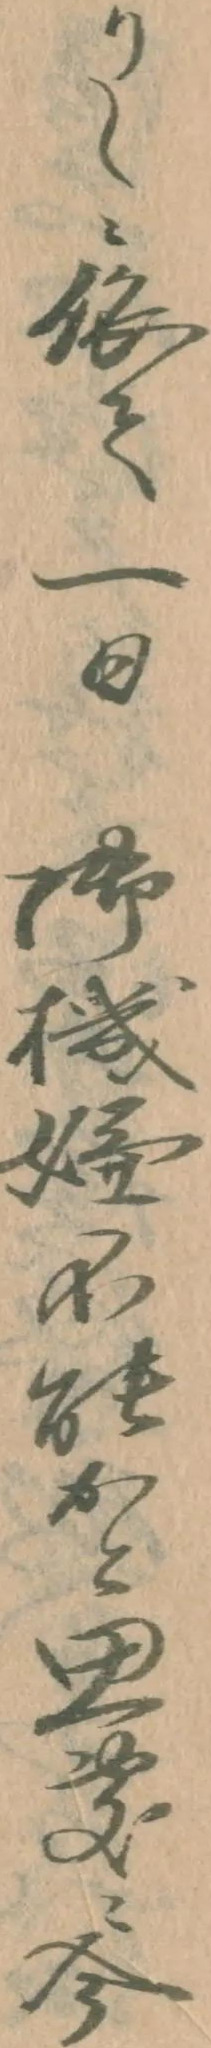りしに依て一日御機嫌不能かと思處に今
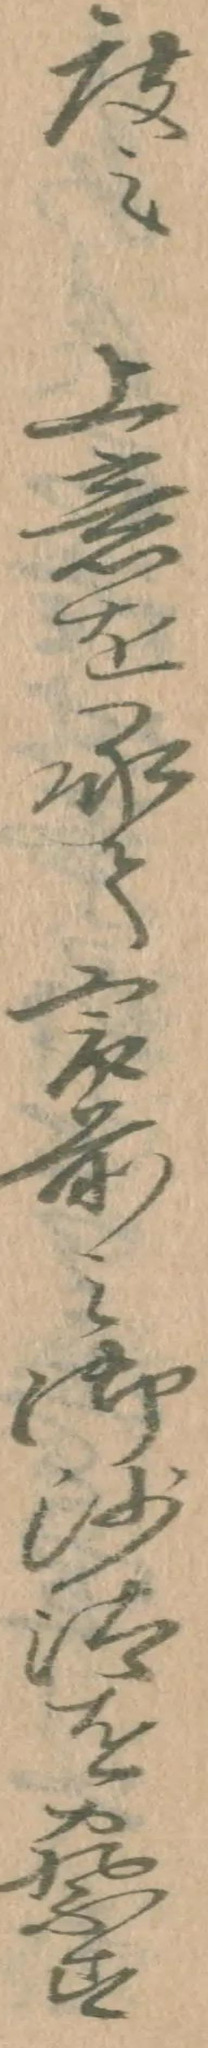度之上意を承て最前之御沙汰を察春
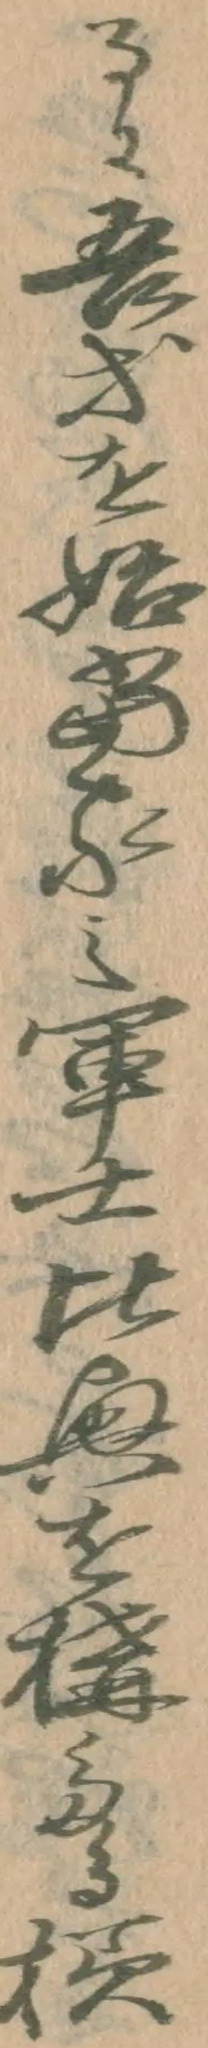る尓吾等を始当家之軍士此奥を構多る様
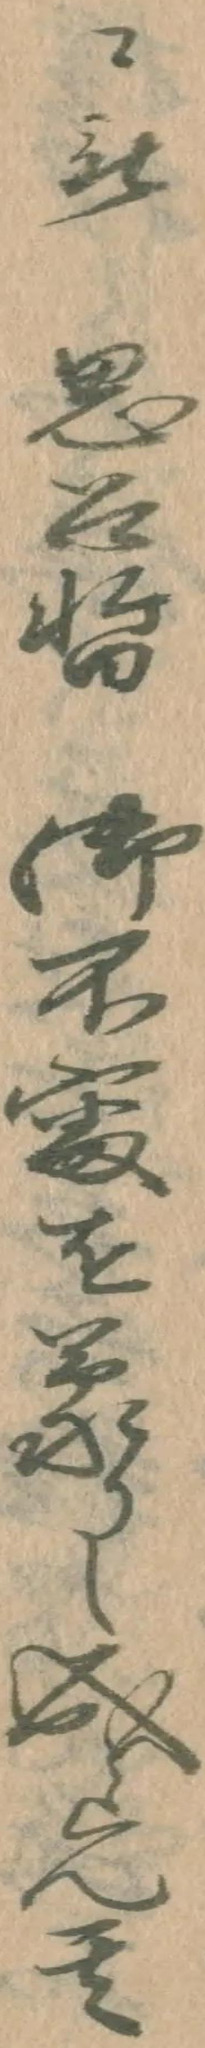に被思召暫御不審を承し成らん其
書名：切支丹御退治記 49巻. [6]
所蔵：国立国会図書館 National Diet Library, JAPAN
